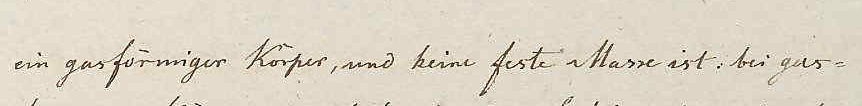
ein gasförmiger Körper, und keine feste Masse ist: bei gas-
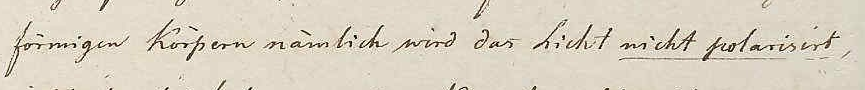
förmigen Körpern nämlich wird das Licht nicht polarisirt,
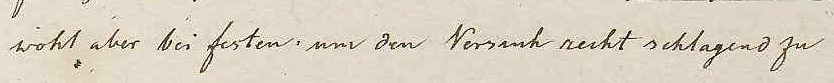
wohl aber bei festen: um den Versuch recht schlagend zu
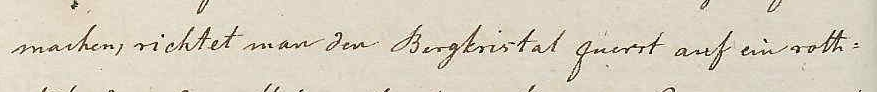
machen, richtet man den Bergkristal zuerst auf ein roth-
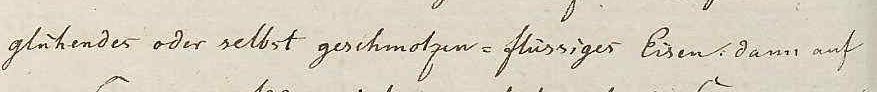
glühendes oder selbst geschmolzen-flüssiges Eisen: dann auf
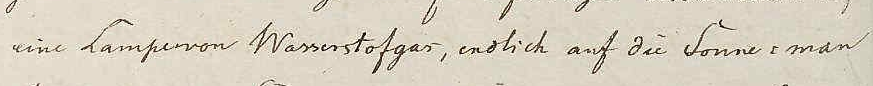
eine Lampe von Wasserstofgas, endlich auf die Sonne: man
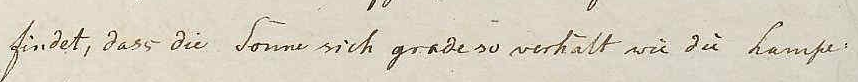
findet, dass die Sonne sich grade so verhält wie die Lampe:
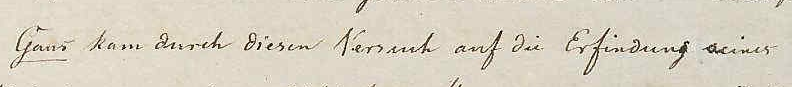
Gaus kam durch diesen Versuch auf die Erfindung seines
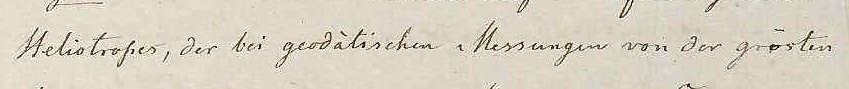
Heliotropes, der bei geodätischen Messungen von der grösten
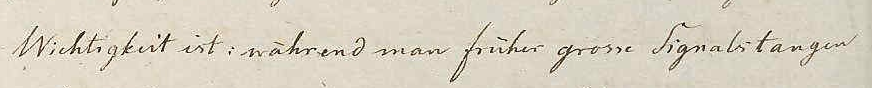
Wichtigkeit ist: während man früher grosse Signalstangen
